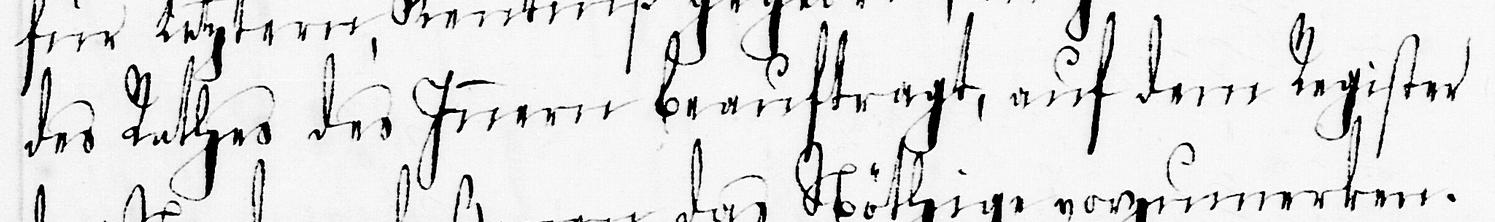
des Rathes des Innern beauftragt, auf dem Register
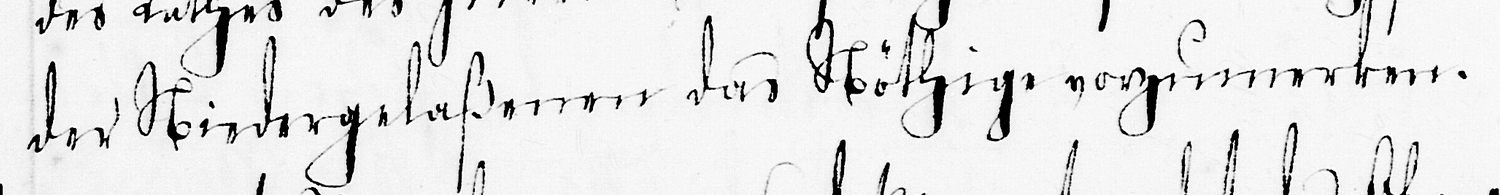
der Niedergelaßenen das Nöthige vorzumerken.
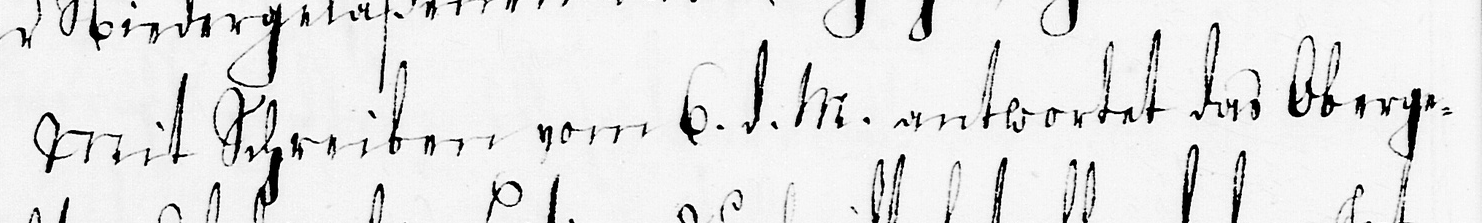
Mit Schreiben vom 6. d. M. antwortet das Oberge¬
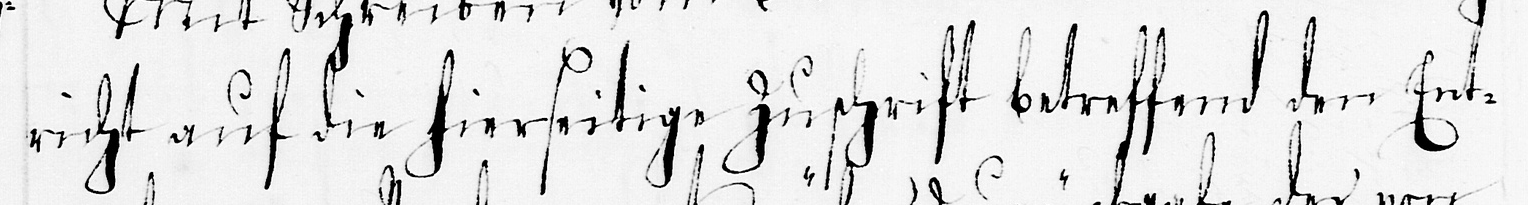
richt auf die hierseitige Zuschrift betreffend den Ent¬
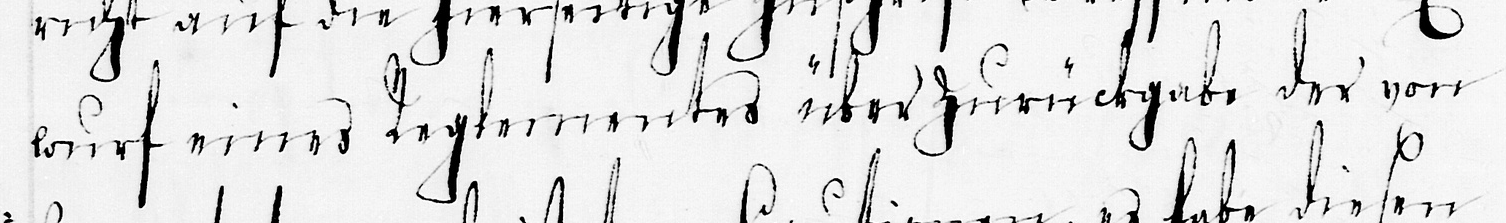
wurf eines Reglementes über Zurückgabe der von
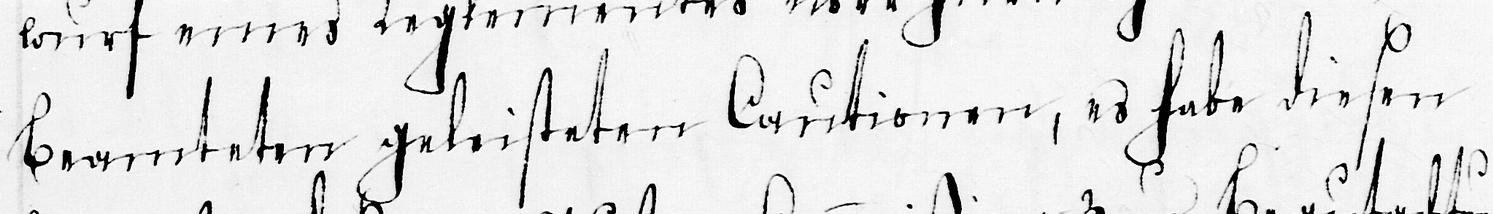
Beamteten geleisteten Cautionen, es habe diesen
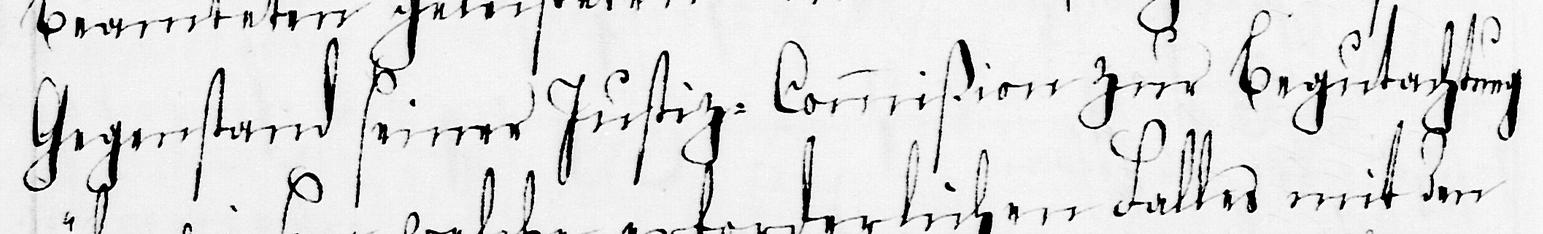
Gegenstand seiner Justiz-Commißion zur Begutachtung
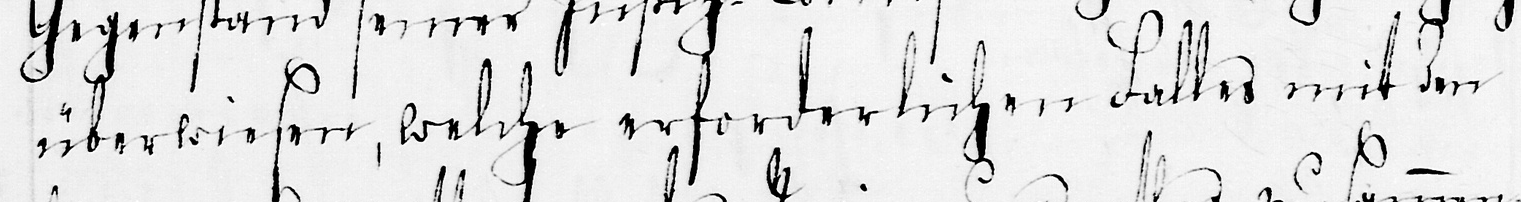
überwiesen, welche erforderlichen Falles mit den
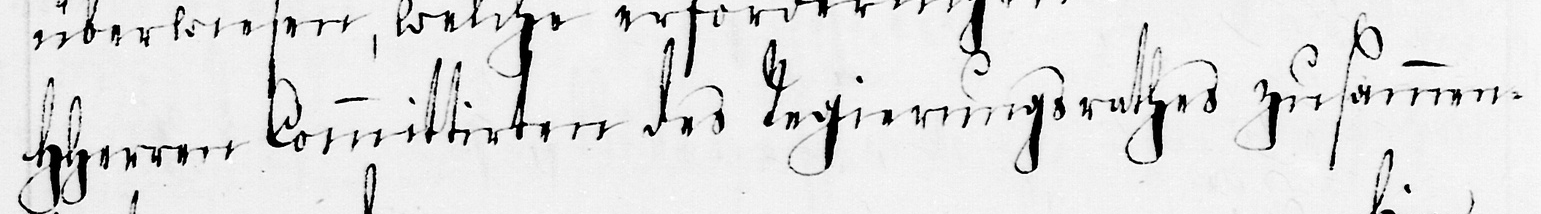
HHerren Committirten des Regierungsrathes zusammen¬
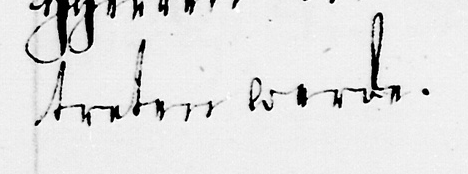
treten werde.
